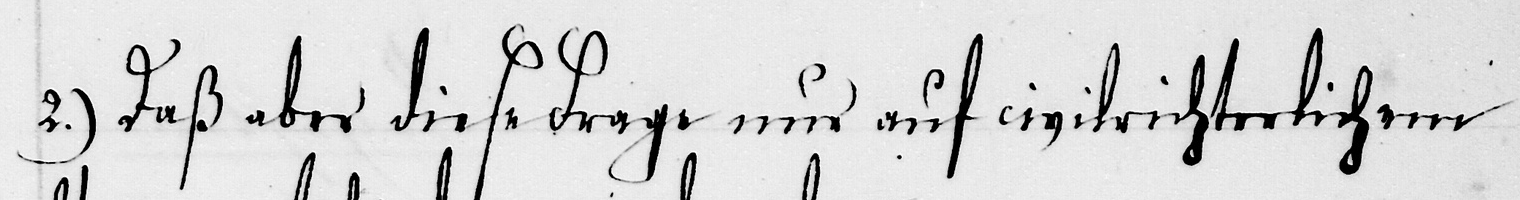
2.) Daß aber diese Frage nur auf civilrichterlichem
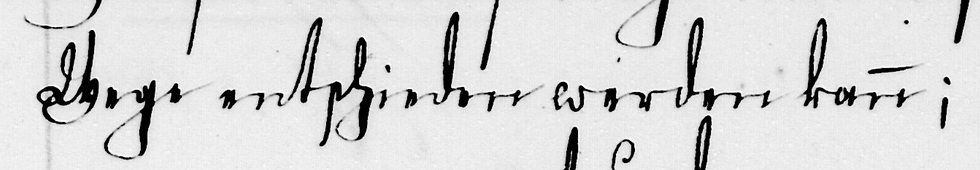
Wege entschieden werden kann;
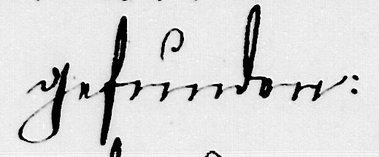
gefunden:
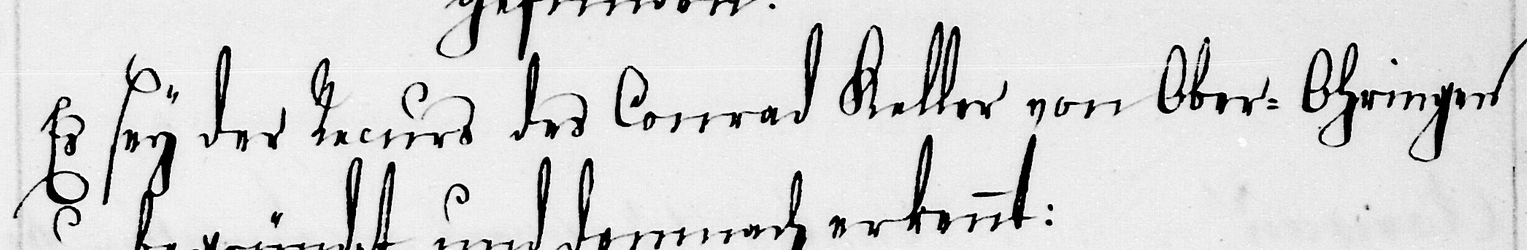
Es sey der Recurs des Conrad Keller von Ober-Ohringen
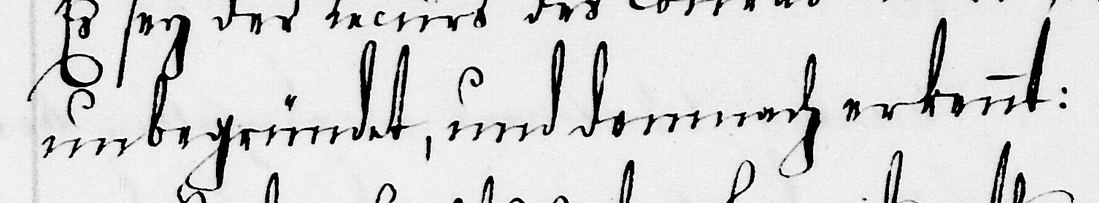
unbegründet, und demnach erkennt:
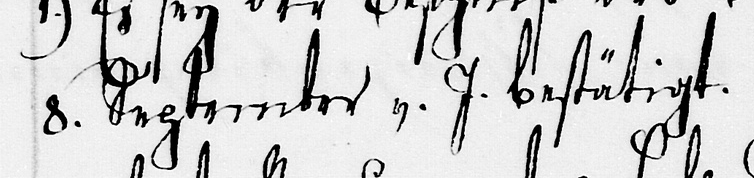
8. September v. J. bestätigt.
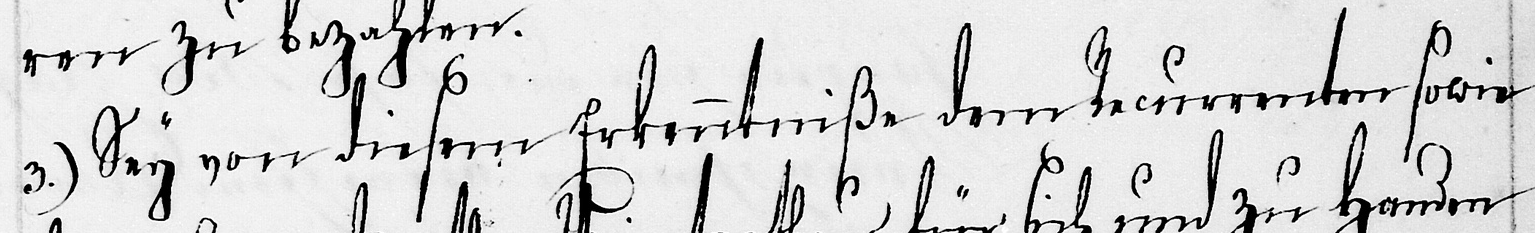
3.) Sey von diesem Erkenntniße dem Recurrenten sowie
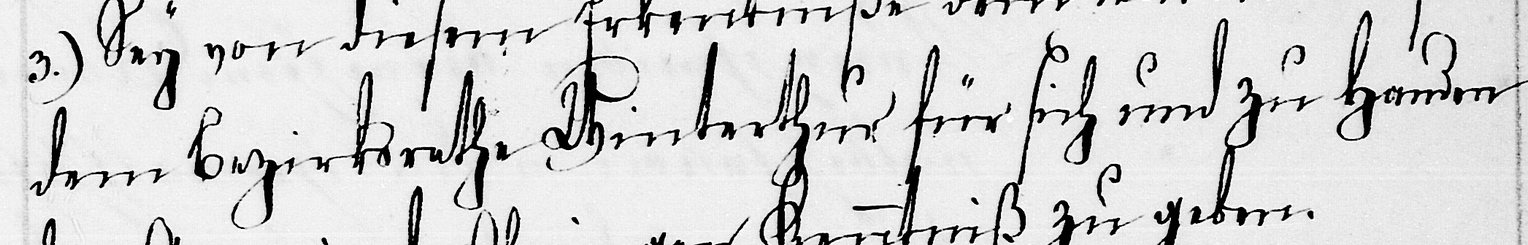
dem Bezirksrathe Winterthur für sich und zu Handen
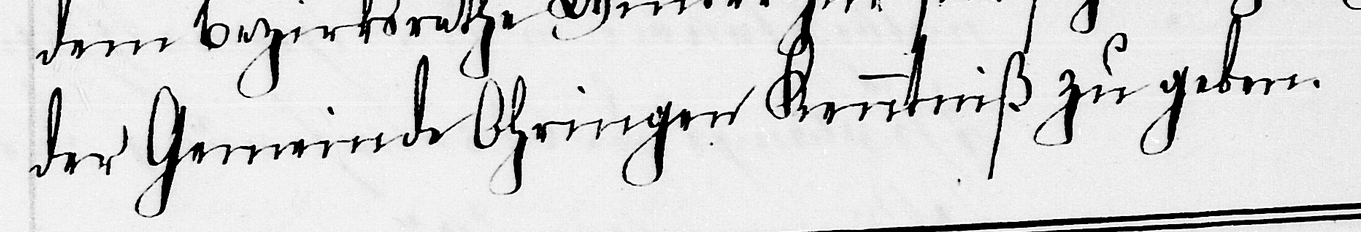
der Gemeinde Ohringen Kenntniß zu geben.
